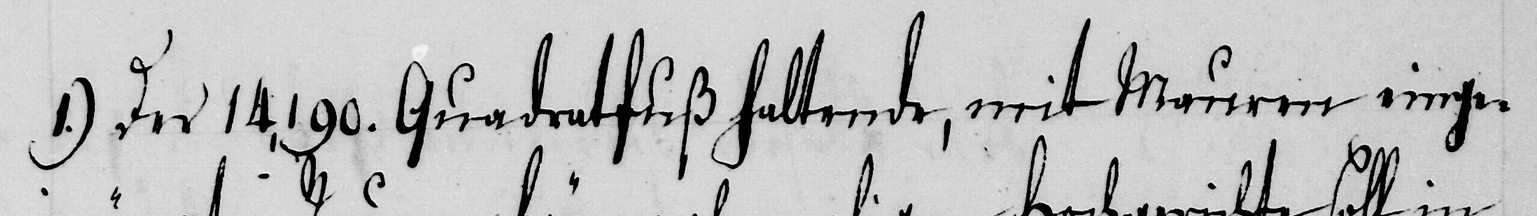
1.) Der 14,190. Quadratfuß haltende, mit Mauern einge¬
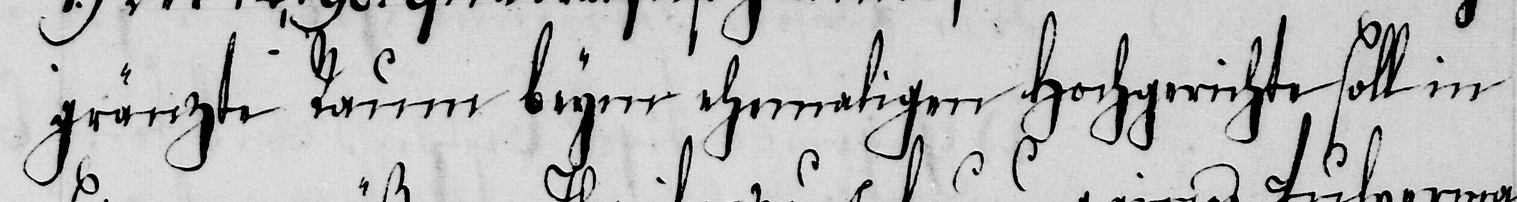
gränzte Raum beym ehemaligen Hochgerichte soll in
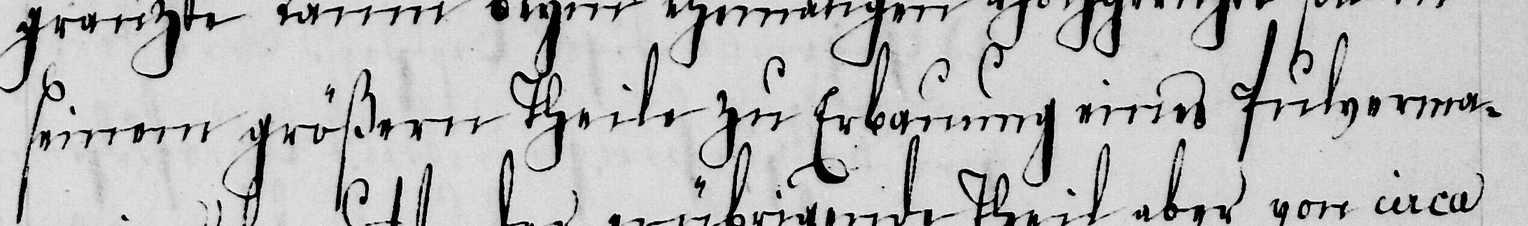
seinem größern Theile zu Erbauung eines Pulverma¬
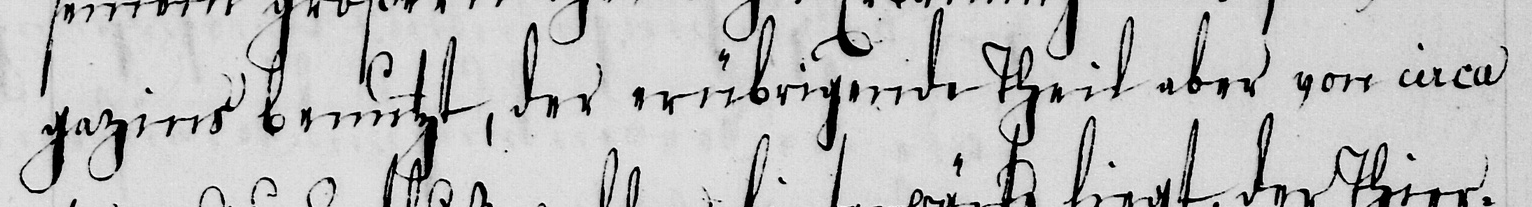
gazins benutzt, der erübrigende Theil aber von circa
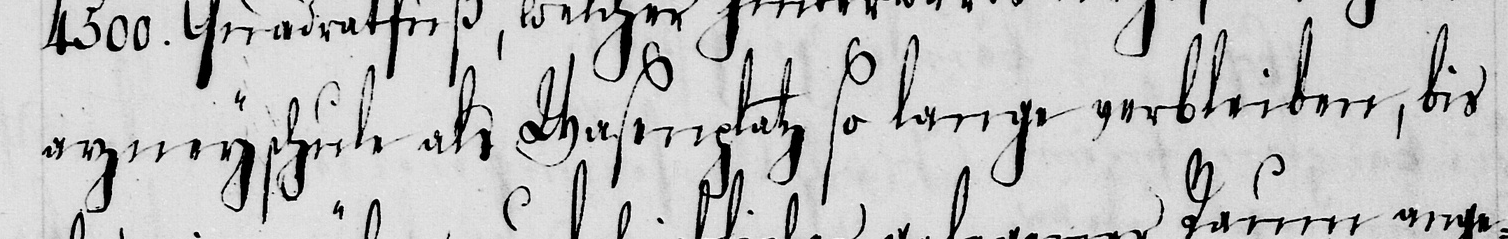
arzneyschule als Wasenplatz so lange verbleiben, bis
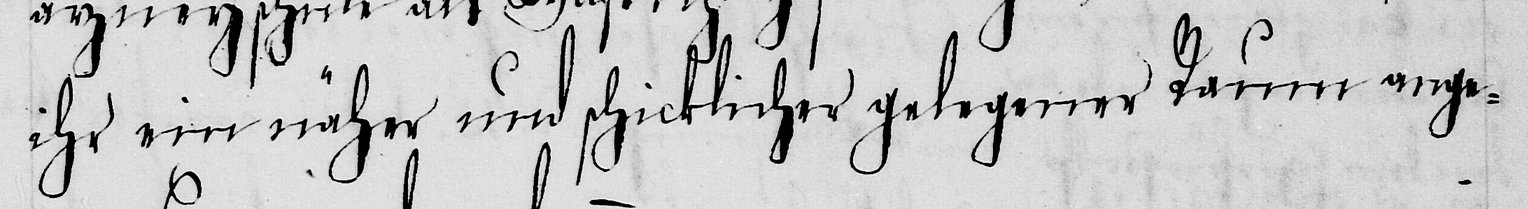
ihr ein näher und schicklicher gelegener Raum ange¬
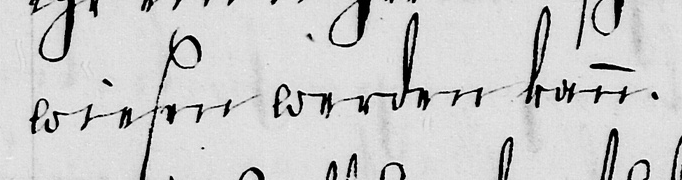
wiesen werden kann.
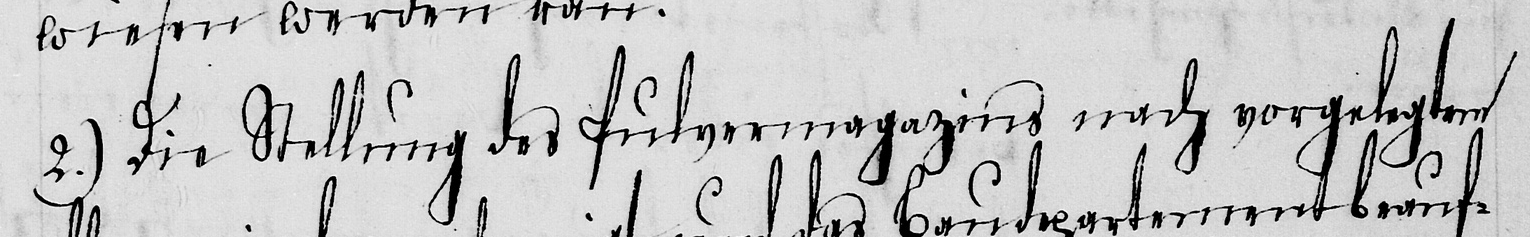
2.) Die Stellung des Pulvermagazins nach vorgelegtem
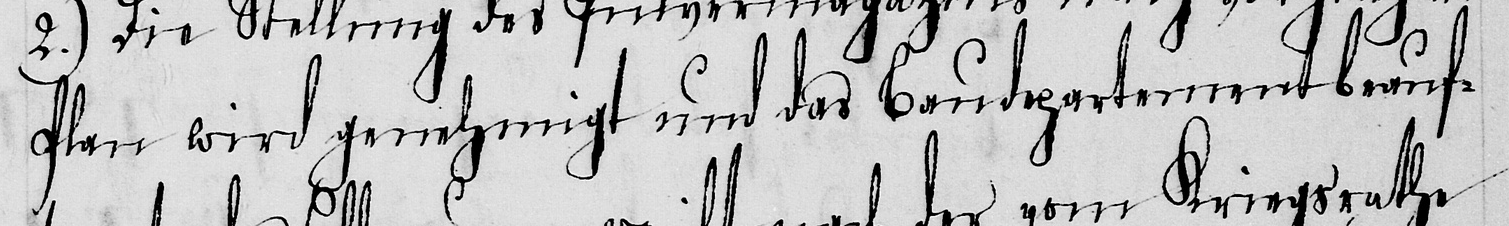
Plan wird genehmigt und das Baudepartement beauf¬
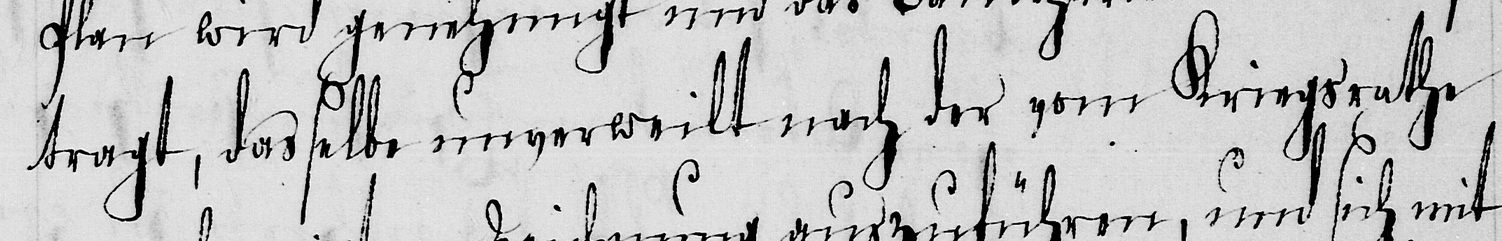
tragt, dasselbe unverweilt nach der vom Kriegsrathe
